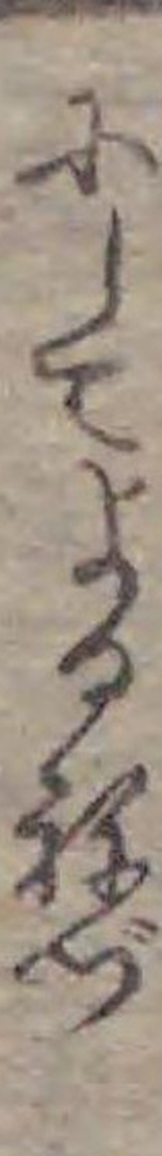にしてよるねづ
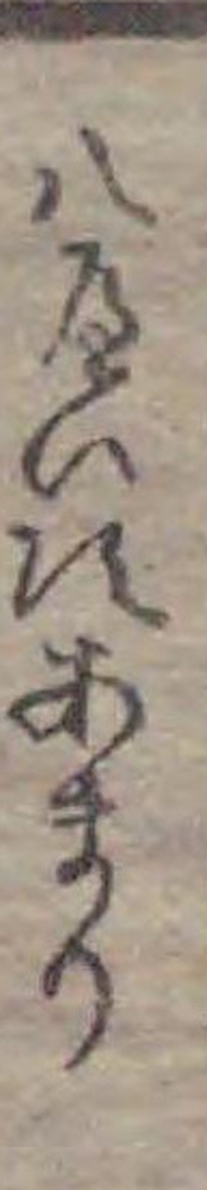八へい次あまり
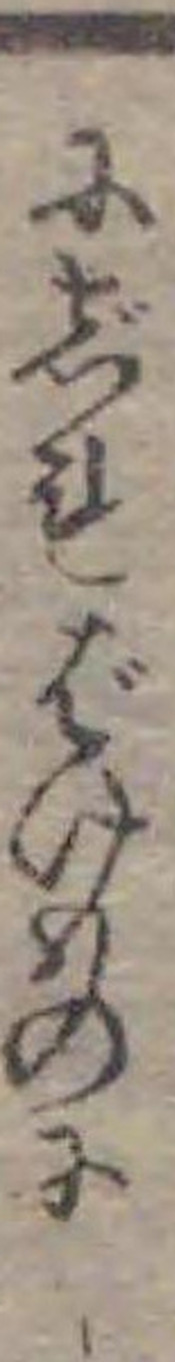にじればけものに
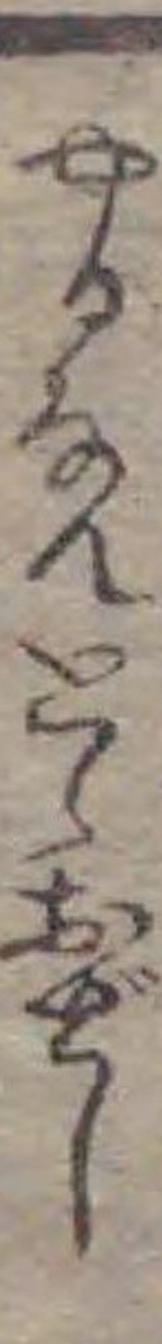やるなんとゝおどし
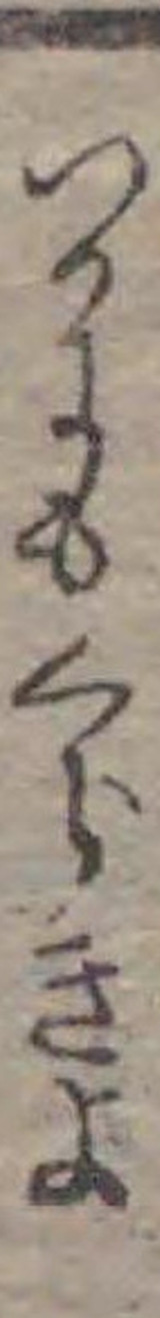いかにもくらきよ
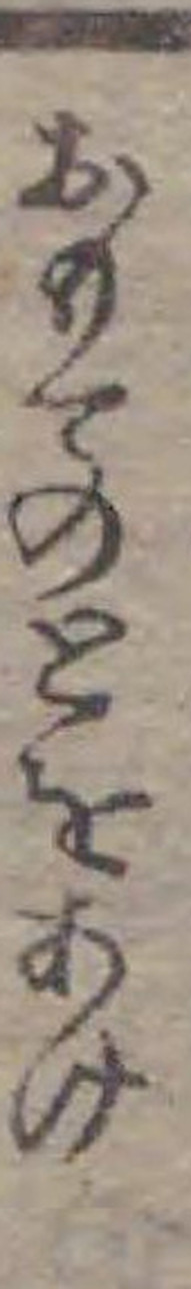おもてのとをあけ
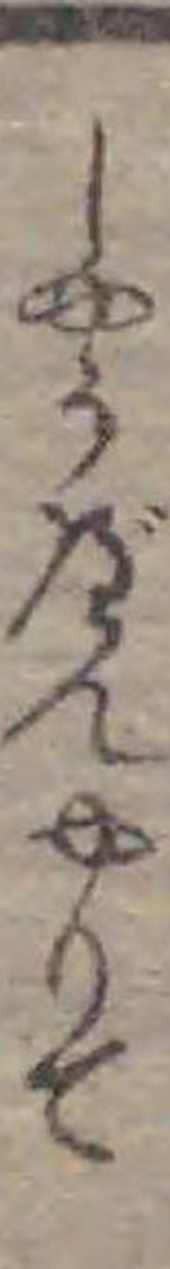しやうべんやりて
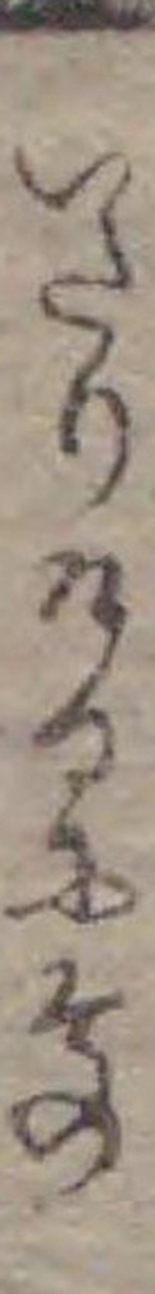いたりけるにその
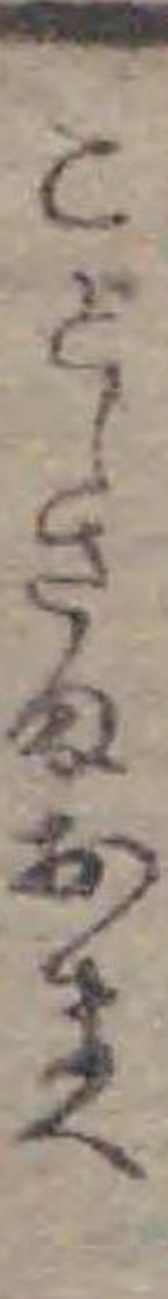ことしさまおまへ
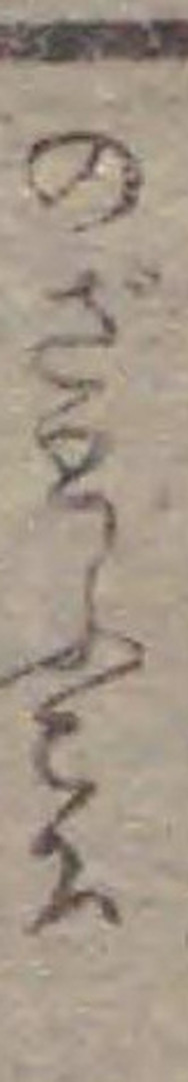のざとふこ
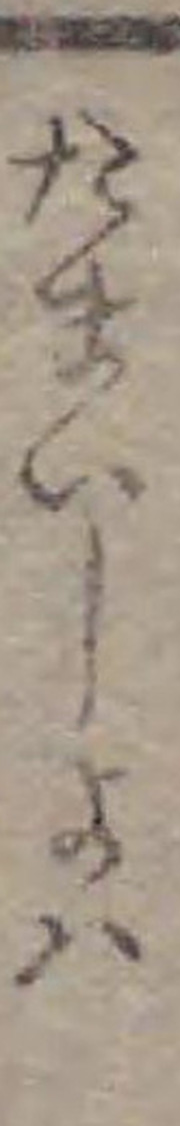たまいしよは
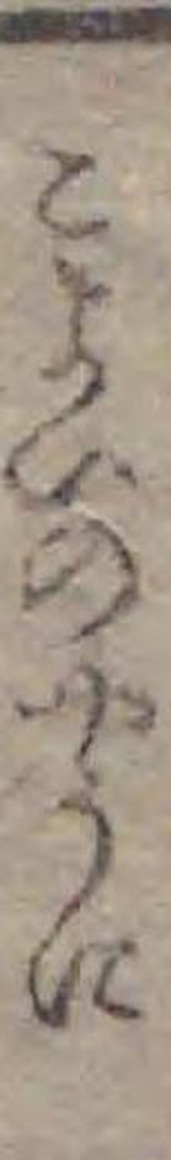こよいのやうに
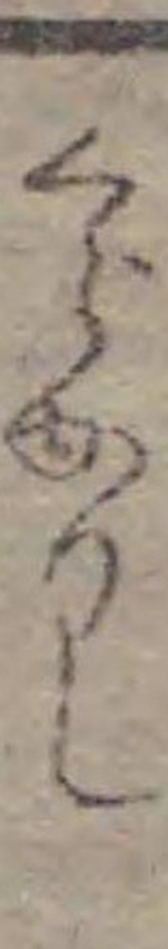くらかりし
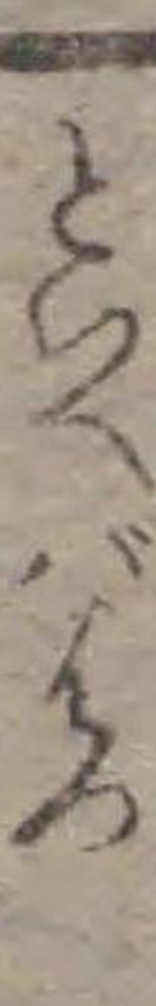といへばはつ
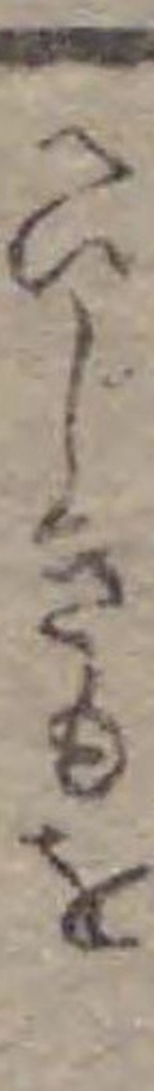へいじきもを
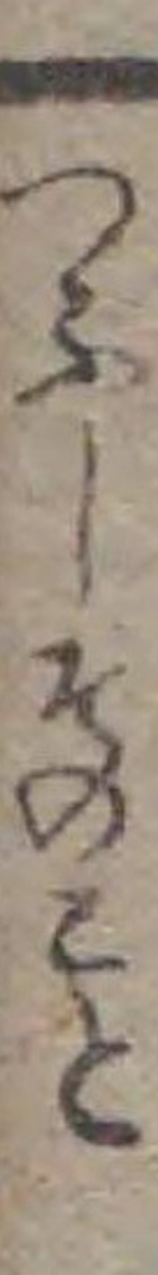つふしそのこと
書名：変化物春遊 : 2巻
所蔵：国立国会図書館 National Diet Library, JAPAN
